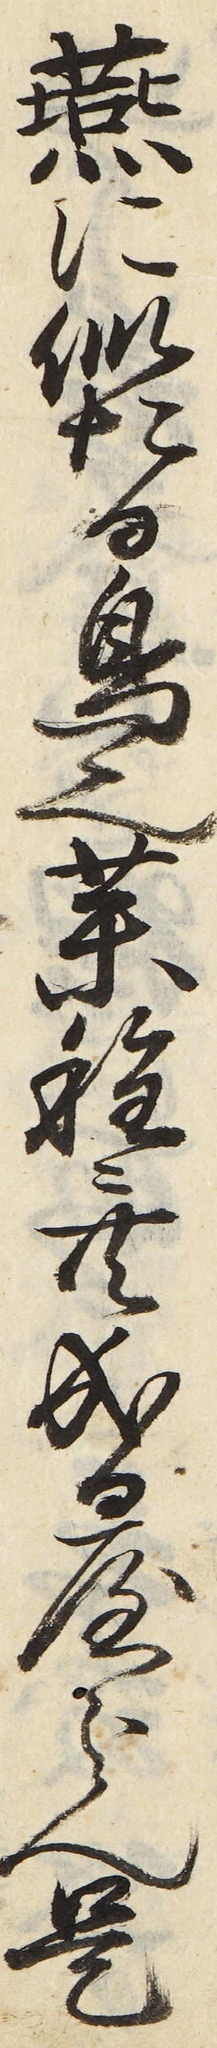燕に似たる鳥也薬種に共成るやらん是
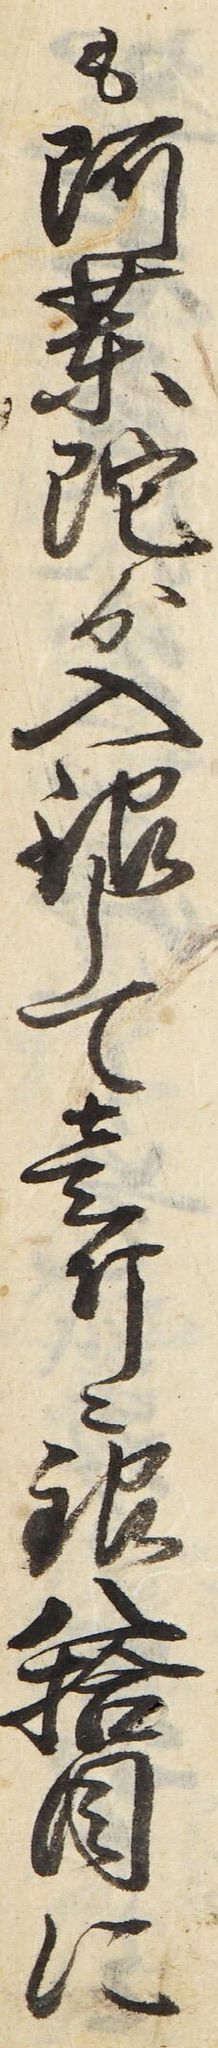も阿蘭陀ゟ入銀して壱斤に銀八拾目に

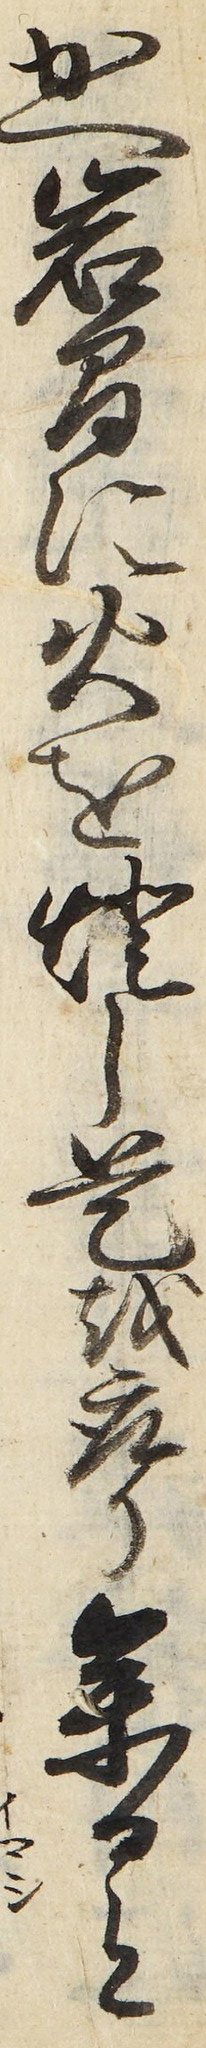かへ岩間に火を燈し是を取り集ると
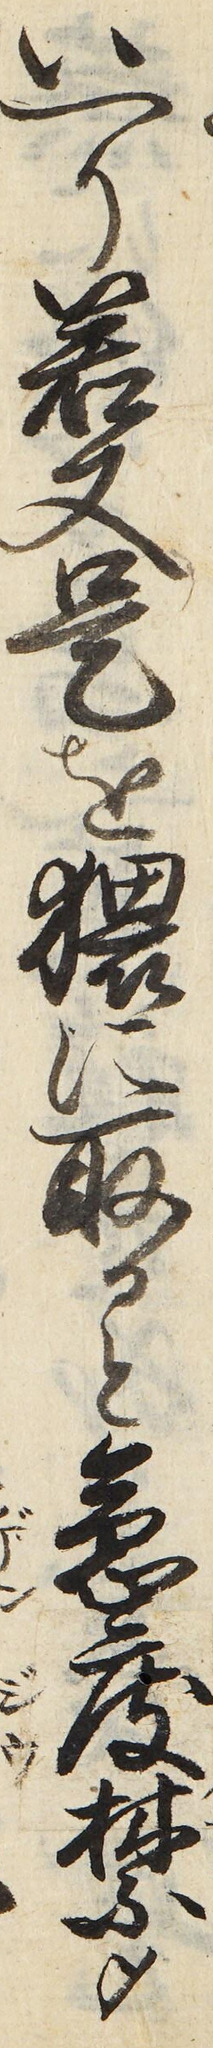いへり若又是を猥に取ると急度禁め
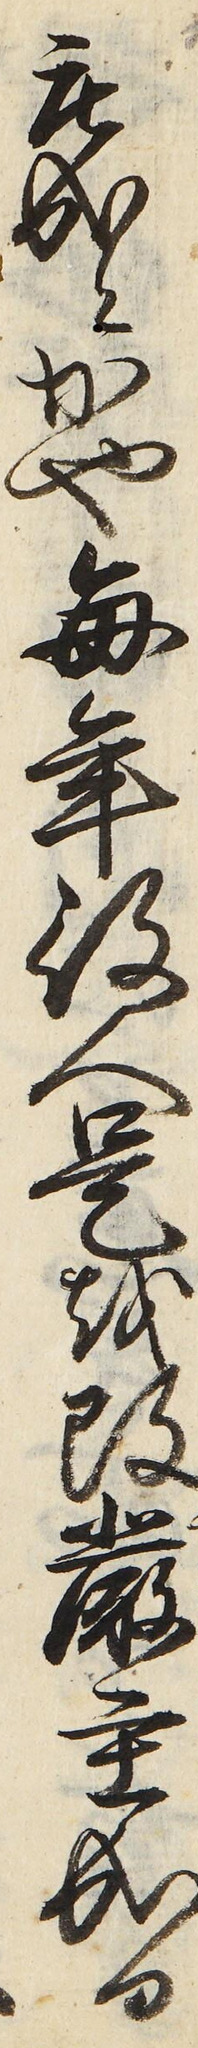被成とかや毎年役人是を改厳重成る
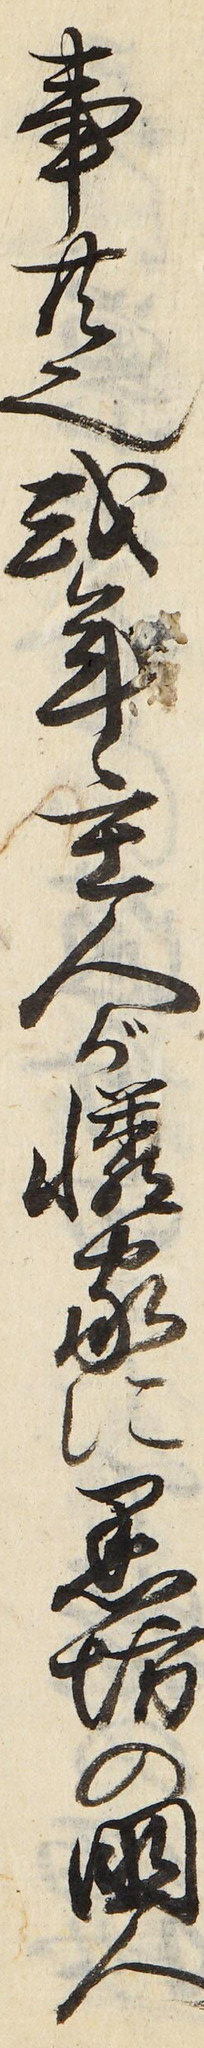事共也或年主人が隣家に黒坊の国人
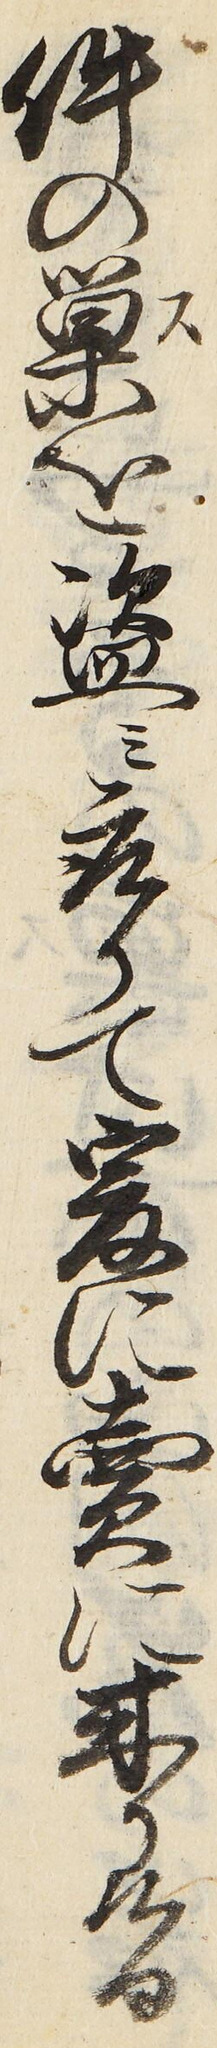件の巣を盗み取りて爰に売に来りける
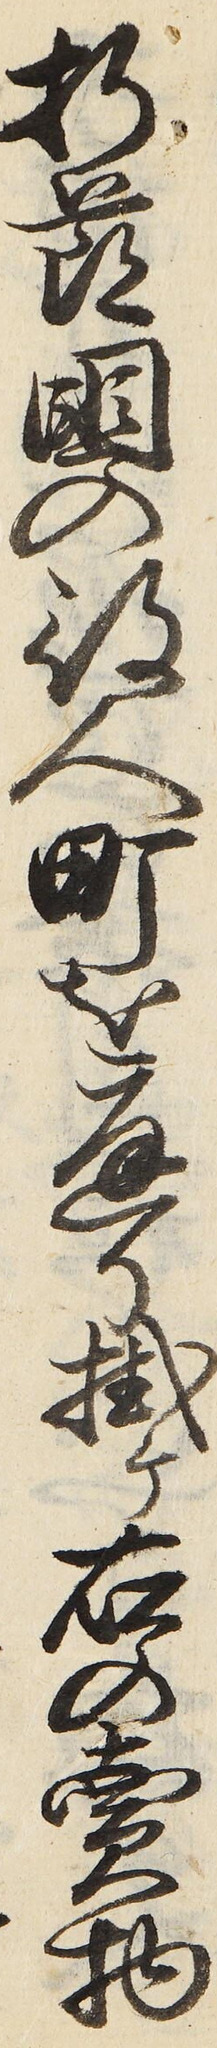折節国の役人町を通り掛け右の売物
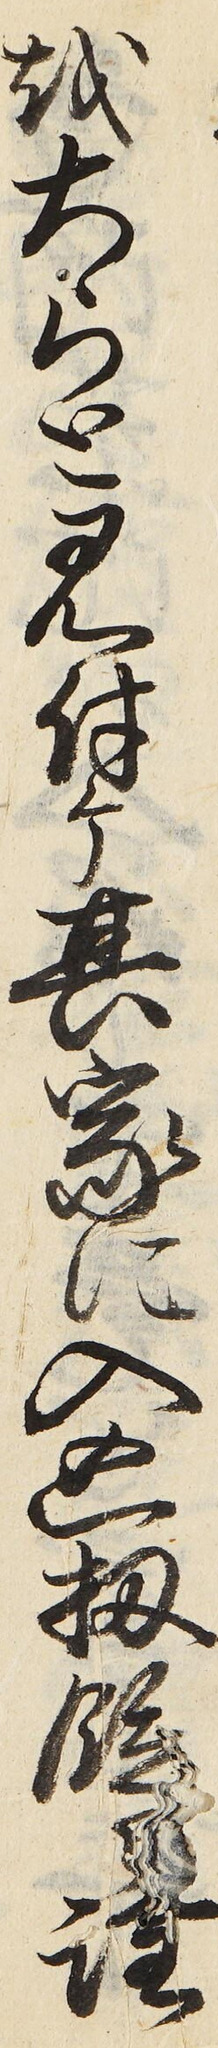をちらと見付け其家に入込扨詮
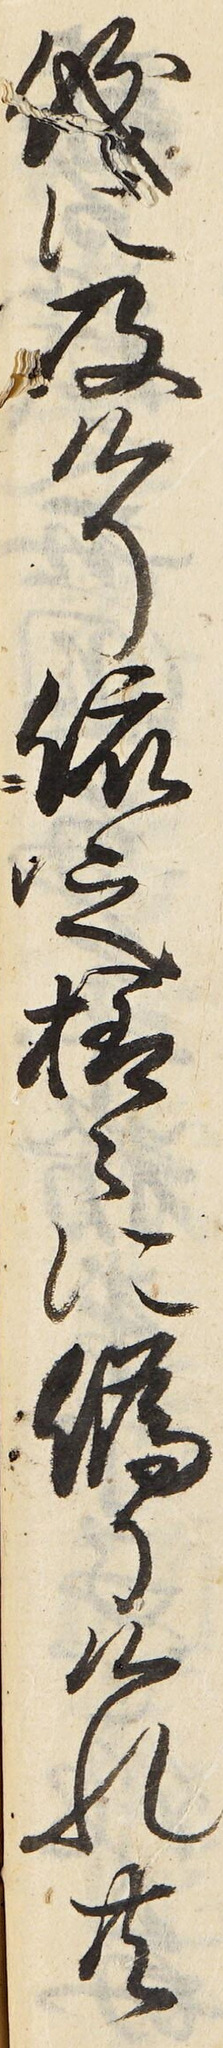儀に及けり依之様々に偽りけれ共
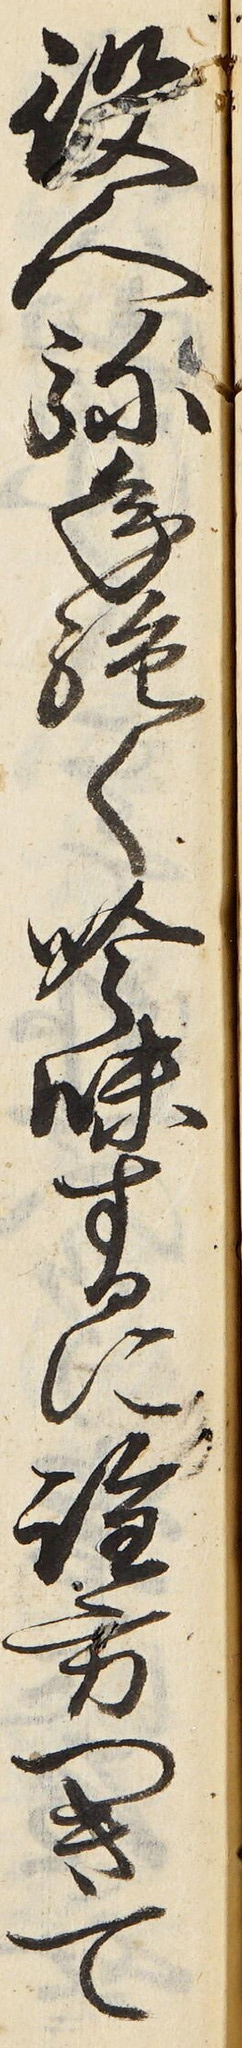役人弥手強く吟味するに詮方つきて
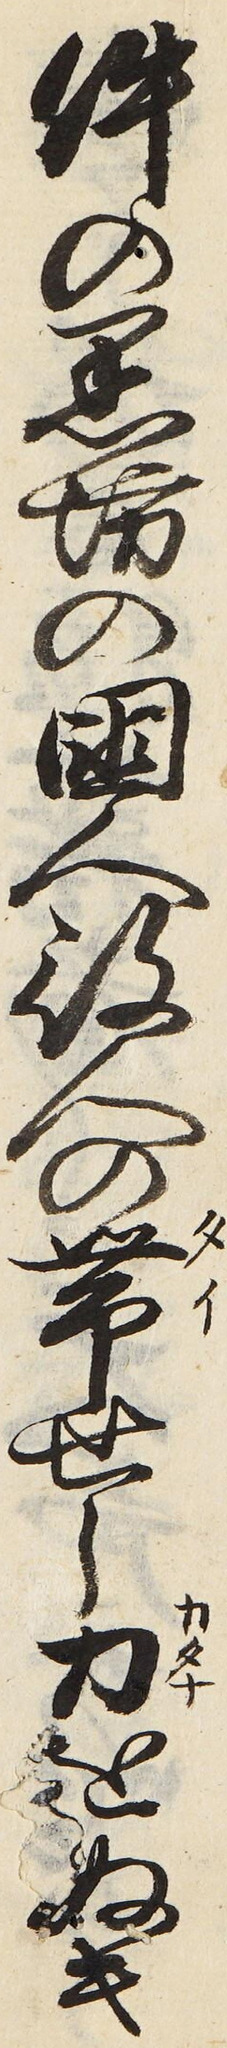件の黒坊の国人役人の帯せし刀をぬき
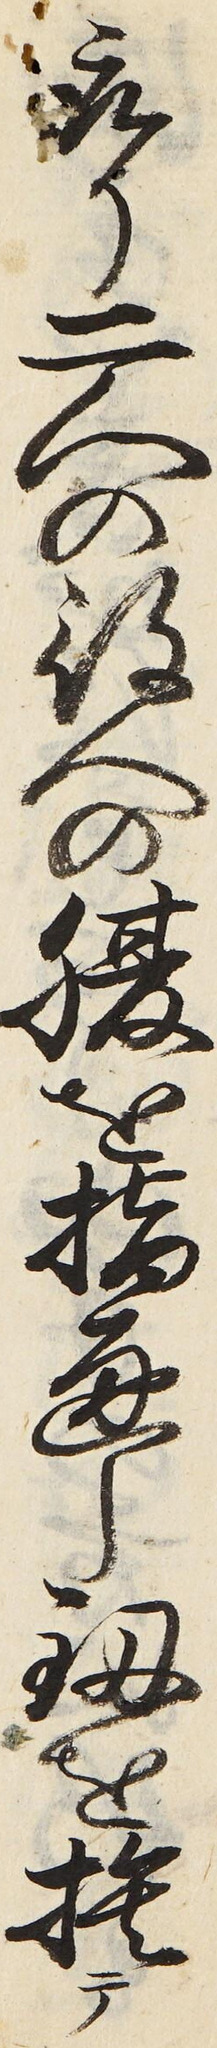取り二人の役人の腹を指通し釼を捨て
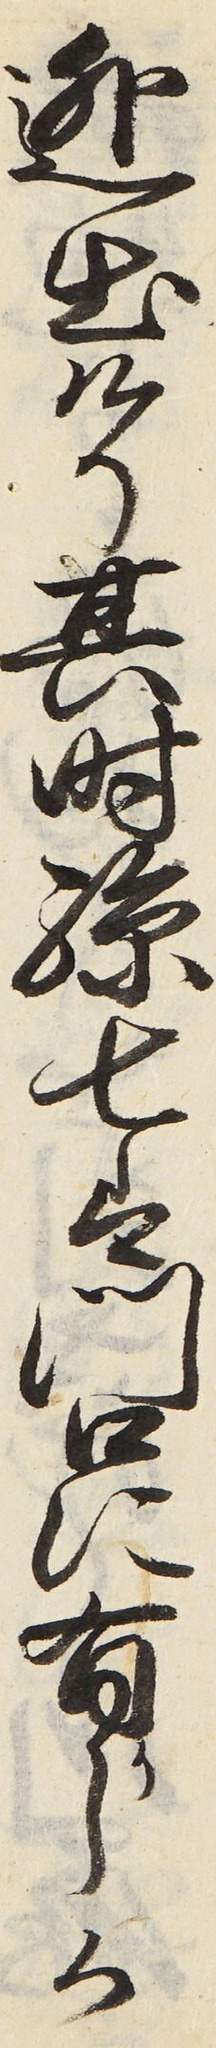逃出けり其時孫七は門口に有りしか
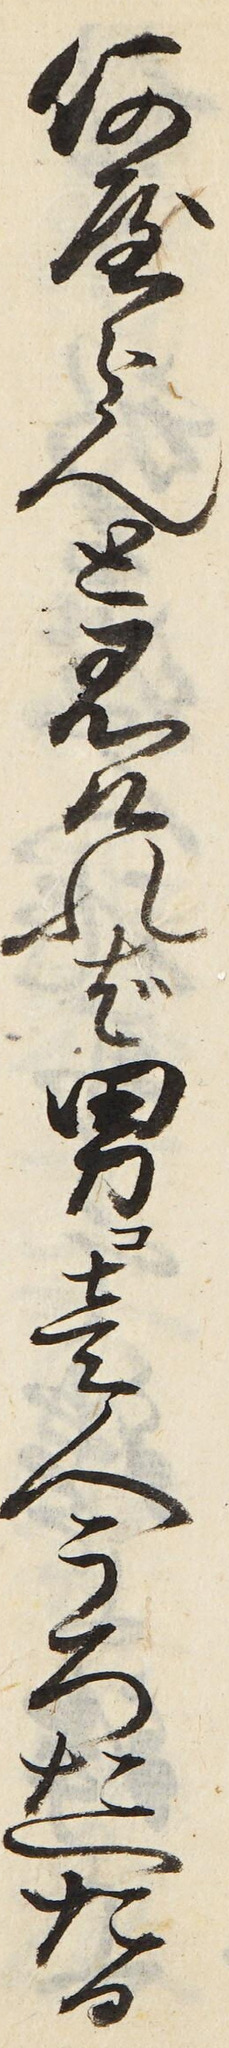何やらんと見ければ男こ壱人うろたへたる
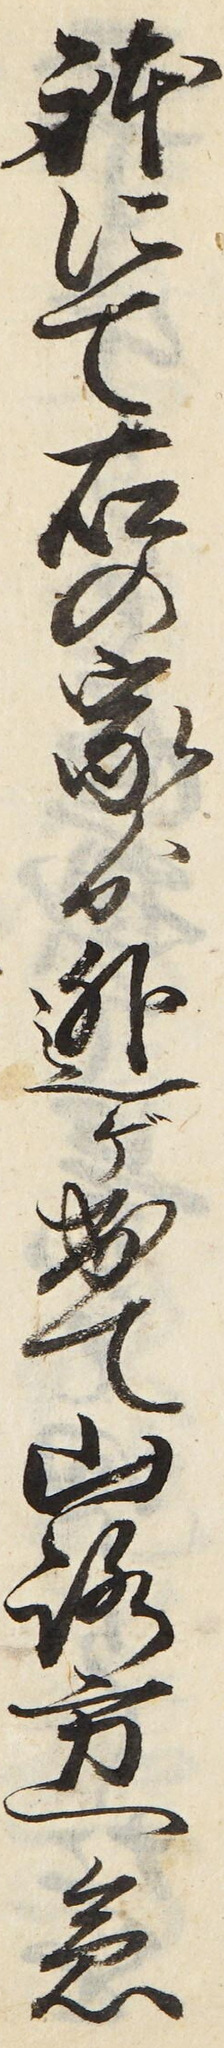躰にて右の家ゟ逃げ出て山路方へ急
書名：華夷九年録
